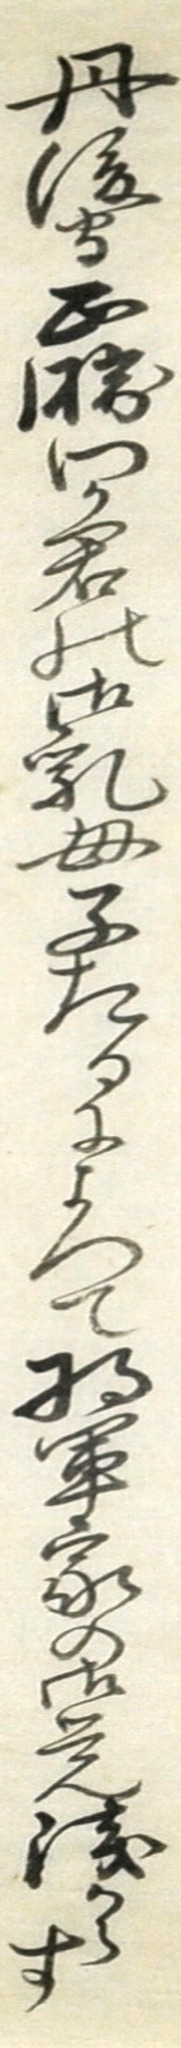丹後守正勝わか君の御乳母子たるによつて将軍家の御覚浅からす
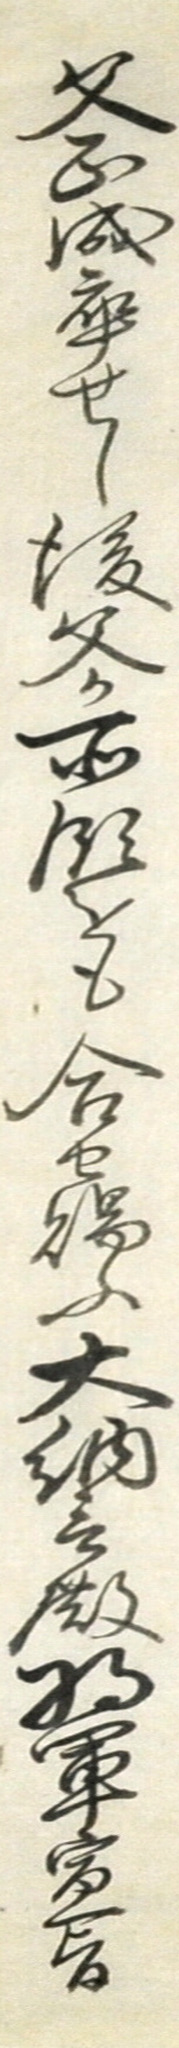父正成卒せし後父か所領をも合せ賜ふ大納言殿将軍宣旨
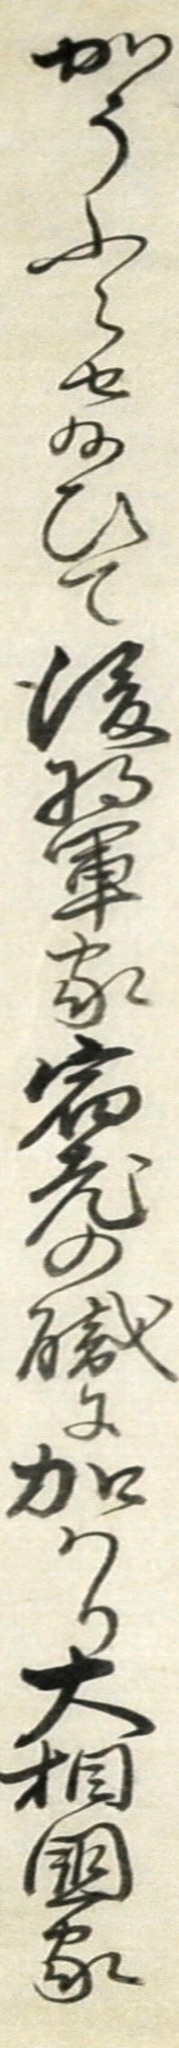かうふらせ給ひて後将軍家宿老の職に加はり大相国家
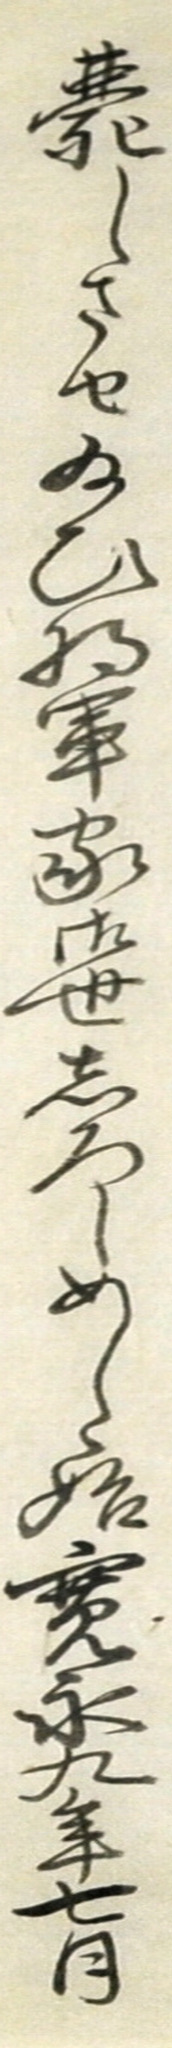薨しさせ給ひ将軍家御世しろしめしゝ始寛永九年七月
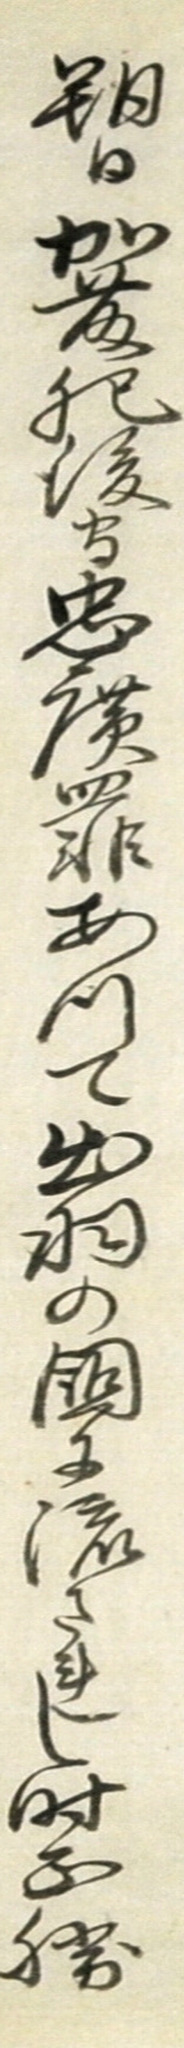朔日加藤肥後守忠広罪あつて出羽の国に流されし時正勝
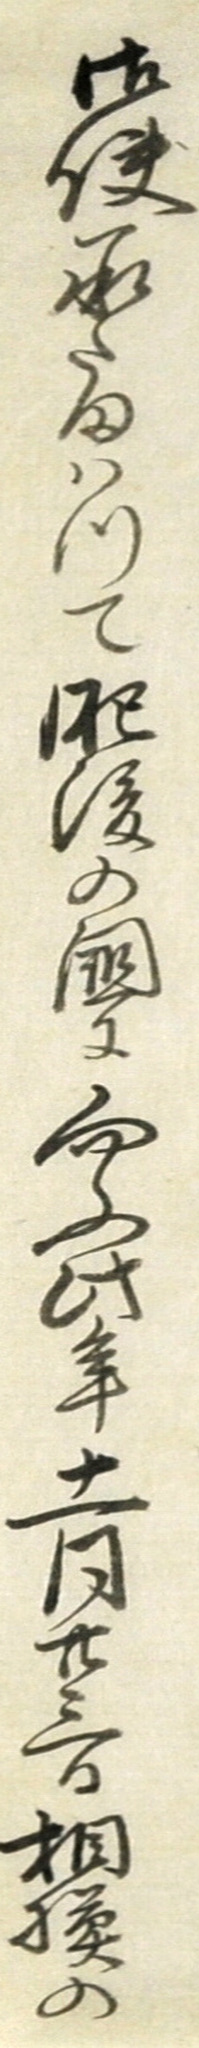御使承たまはつて肥後の国に向ふ此年十一月廿三日相模の

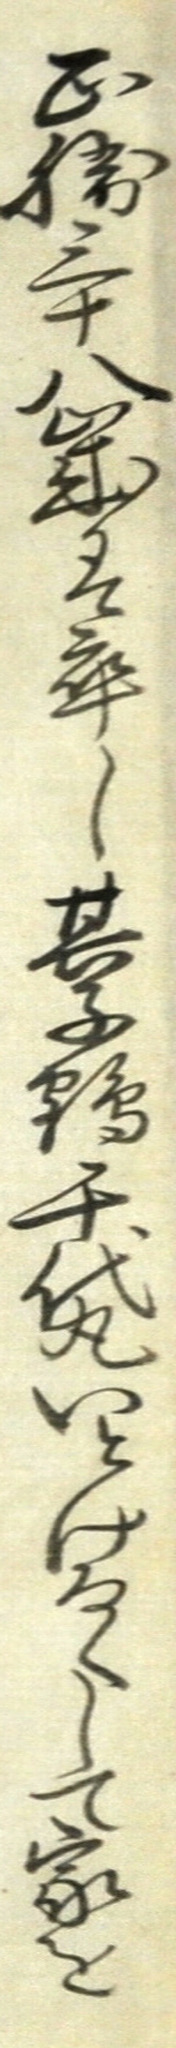正勝三十八歳にて卒し其子鶴千代丸いとけなくして家を
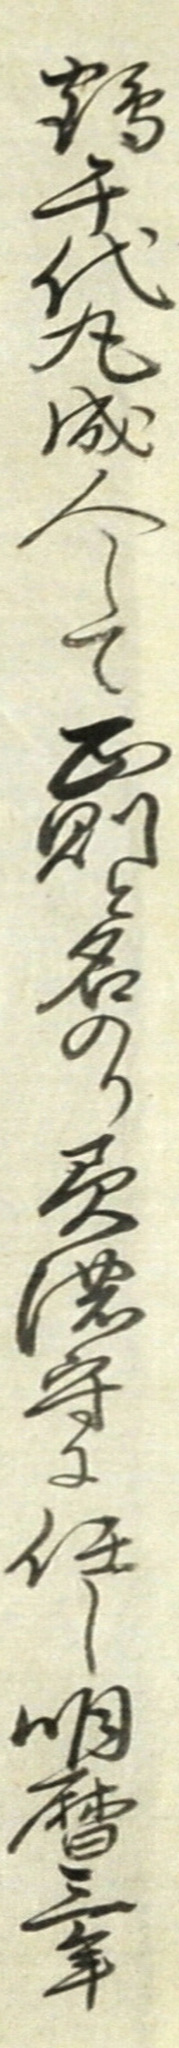鶴千代丸成人して正則と名のり美濃守に任し明暦三年
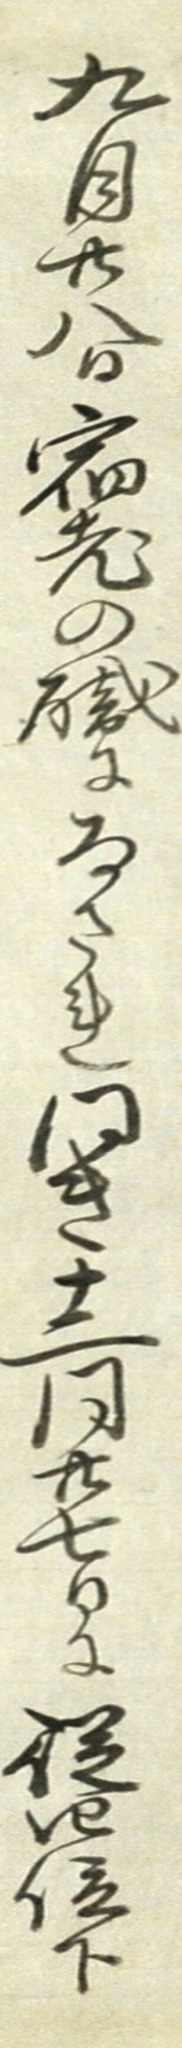九月廿八日宿老の職になされ同き十二月廿七日に従四位下
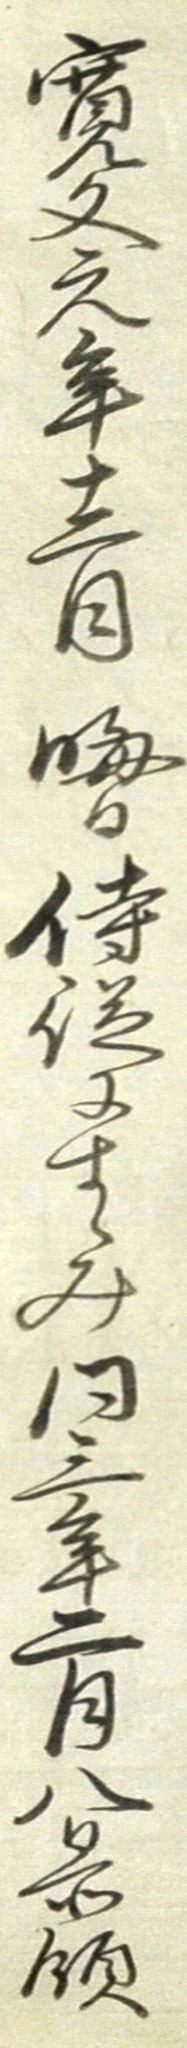寛文元年十二月晦日侍従にすゝみ同三年二月八日所領
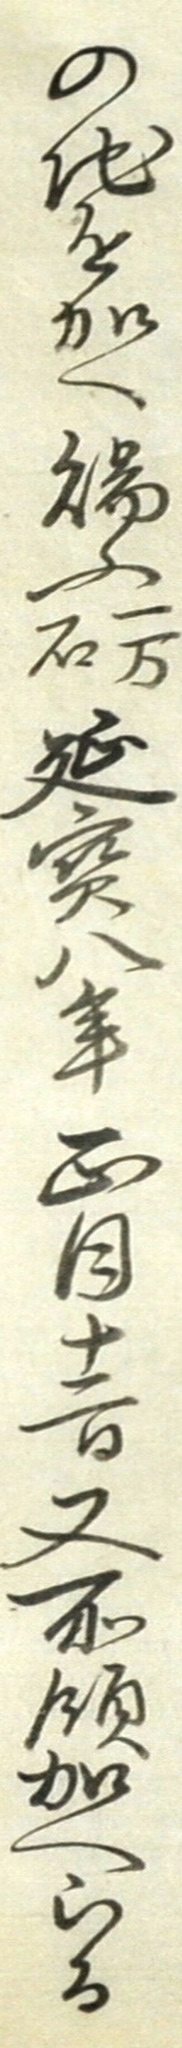の地を加へ賜ふ一万石延宝八年正月十二日又所領加へらる
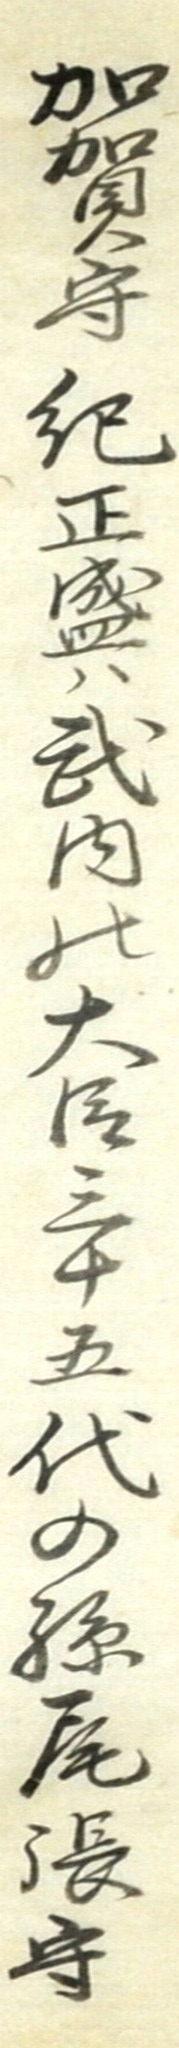加賀守紀正盛は武内の大臣三十五代の孫尾張守
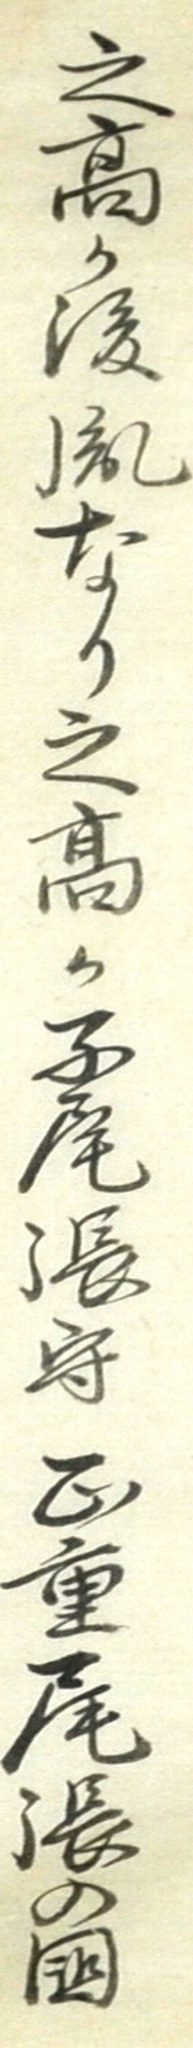之高か後胤なり之高か子尾張守正重尾張の国
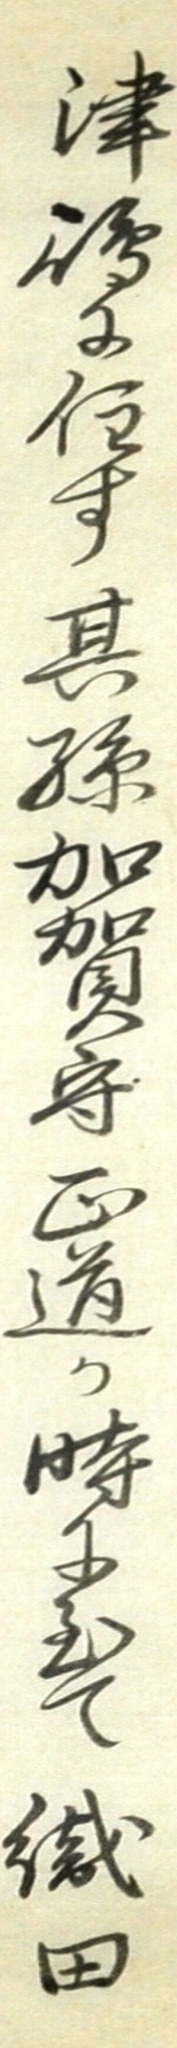津島に住す其孫加賀守正道か時に至て織田
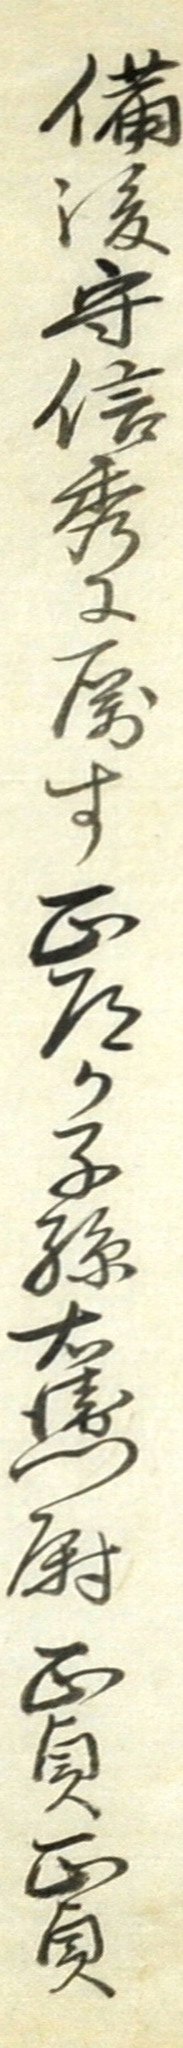備後守信秀に属す正道か子孫右衛門尉正貞正貞
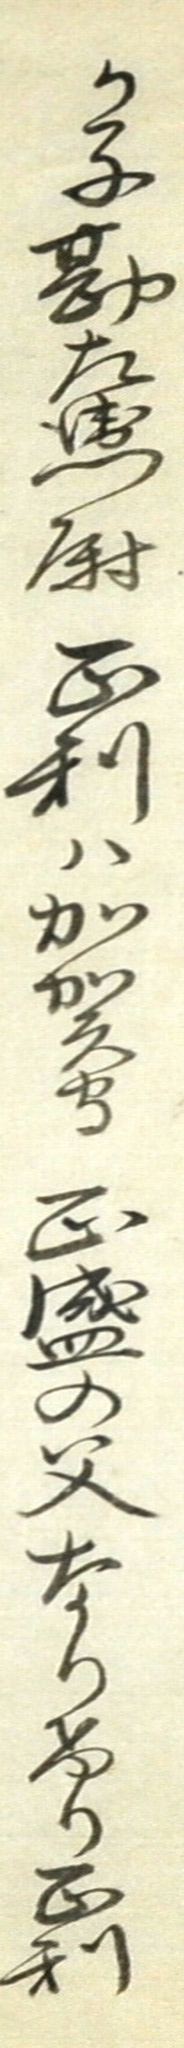か子勘左衛門尉正利は加賀守政盛の父なりけり正利
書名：藩翰譜（六）
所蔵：伊那市立高遠町図書館・合同会社AMANE
